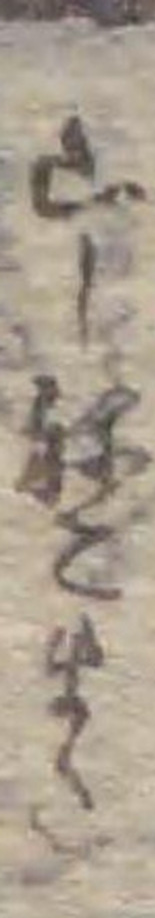山しねこまた
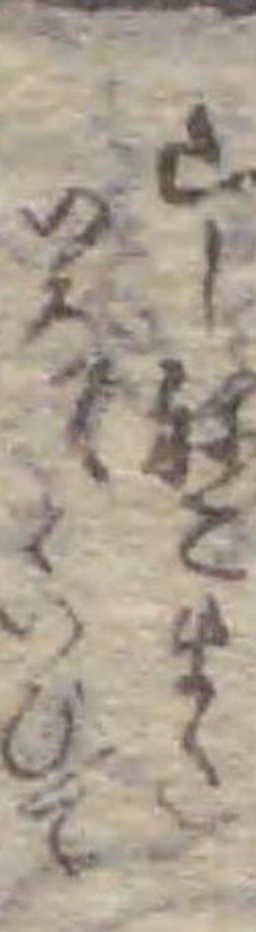いろ〳〵といひて
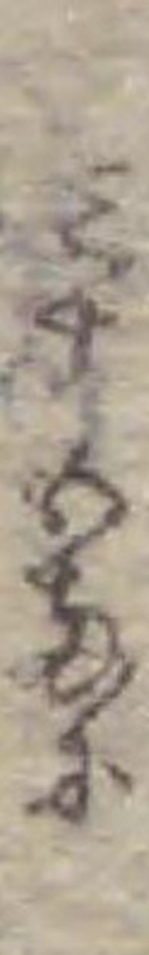三十五両に
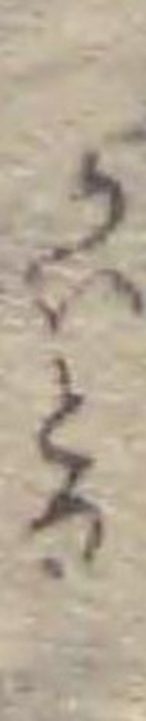かいとる
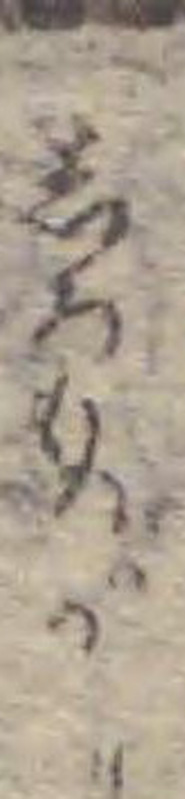しろものか
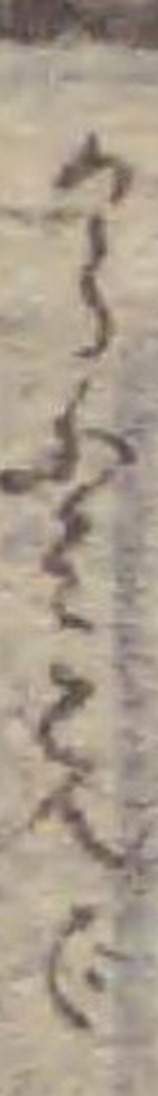からふみこんで
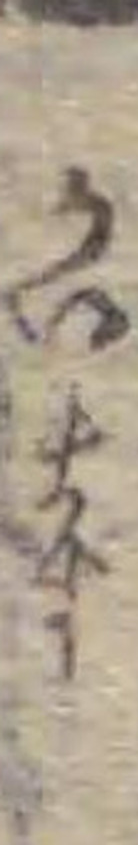かいます
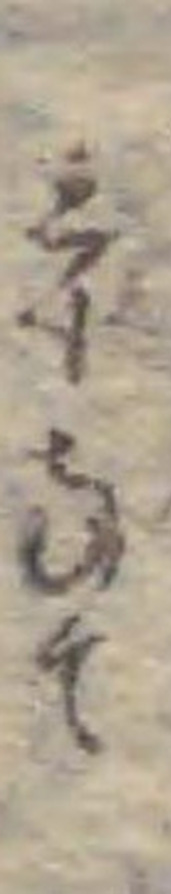三十両て
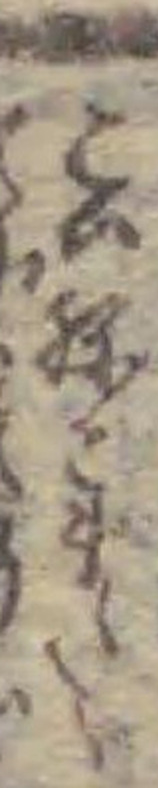こはねこまたが
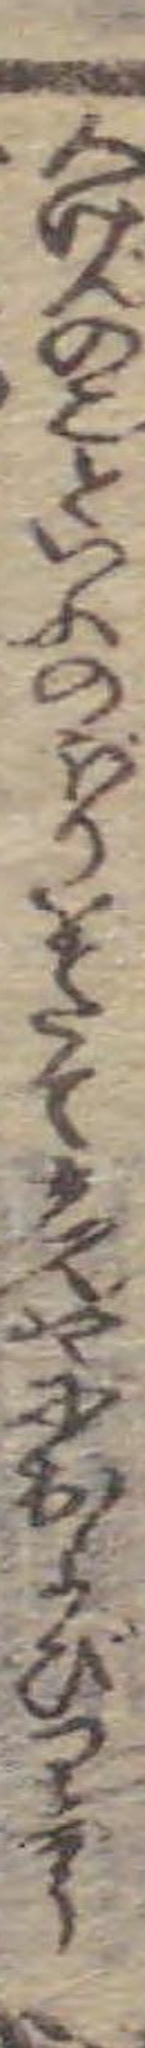人げんのこといふのぼりをたてしんやにおよびりやう
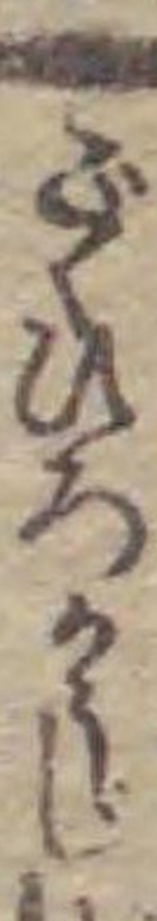ごくひろかうじに
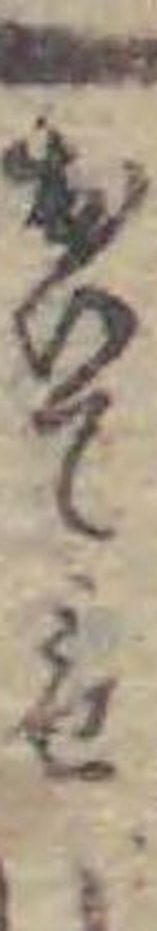おいてみせ
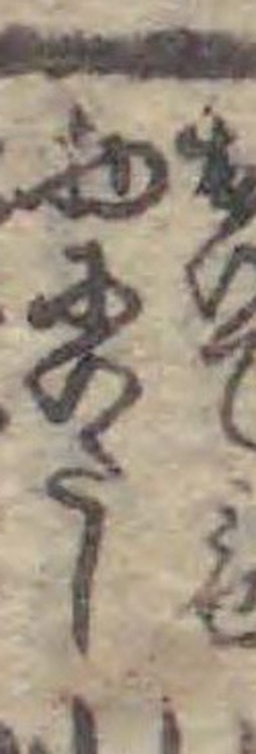物にいたし
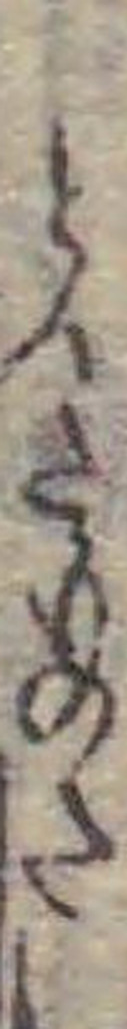とんたものだ
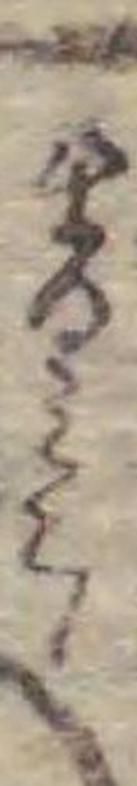まるみこし
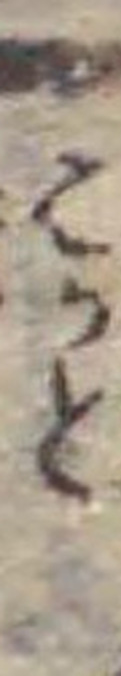こかと
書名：[化物一代記] : 5巻
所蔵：国立国会図書館 National Diet Library, JAPAN
